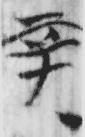辛
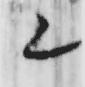乙
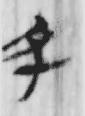丑
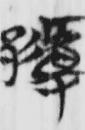○（且）
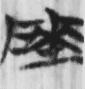陵
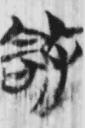○（令）
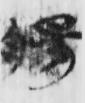腸
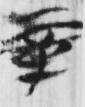章
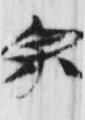余
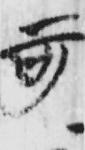可
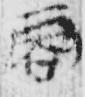丙
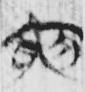寅
